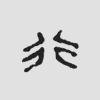行
